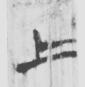上
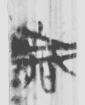者
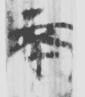不
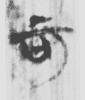可
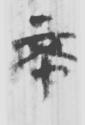不
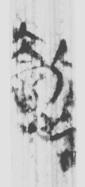{仌言斤心}
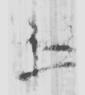上
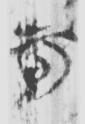可
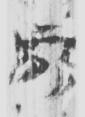所
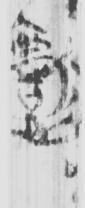{仌言斤心}
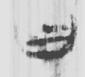曰
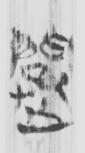{興止}
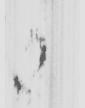人
